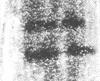二
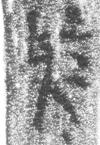○（簠）
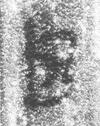○（梁）
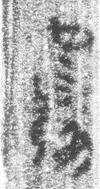{金獻}（甗）
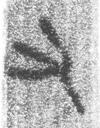又
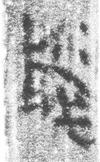{金少衣}
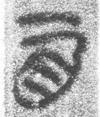百
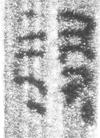詹（擔）
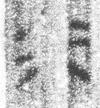米
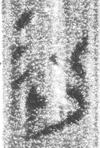紫
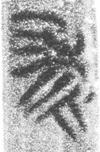緅
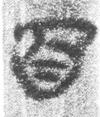百
